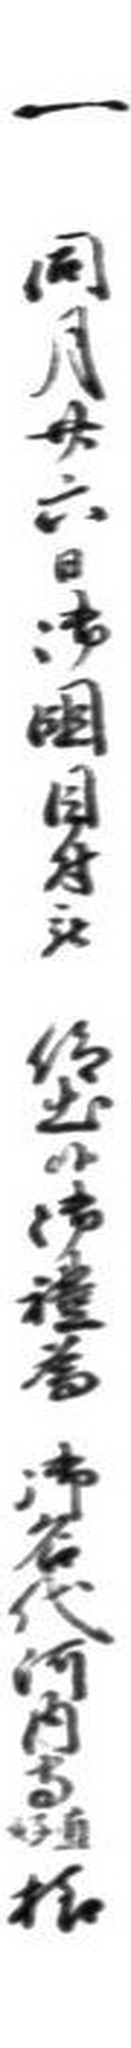一同月廿六日御国目付被仰出候御礼為御名代河内守直好様
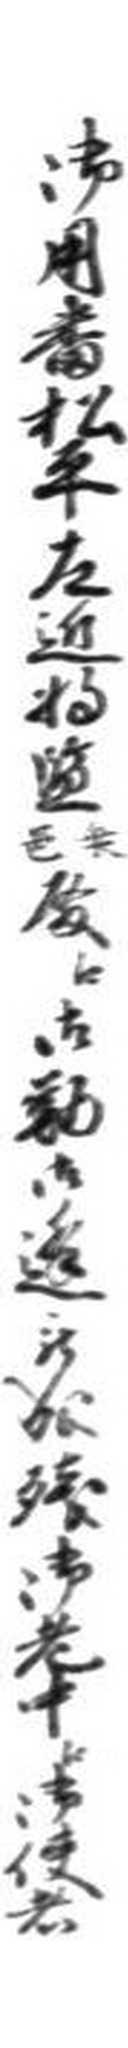御用番松平左近将監乗邑殿江御勤御進被成残御老中江御使者

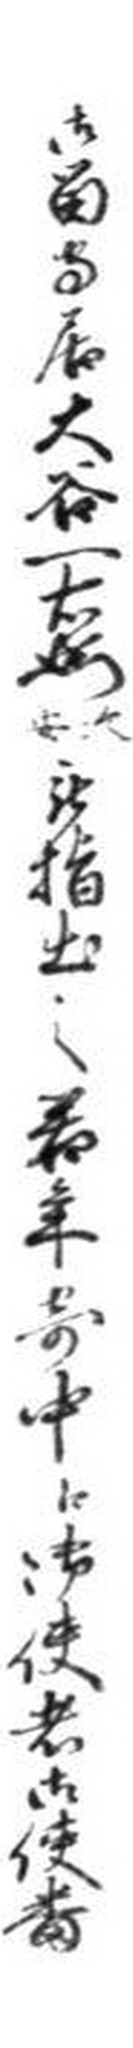御留守居大谷一右衛門次安被指出之若年寄中江御使者御使番
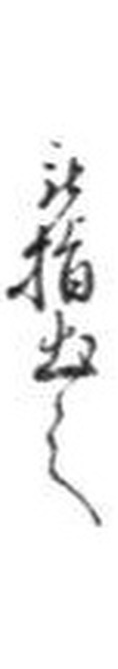被指出之
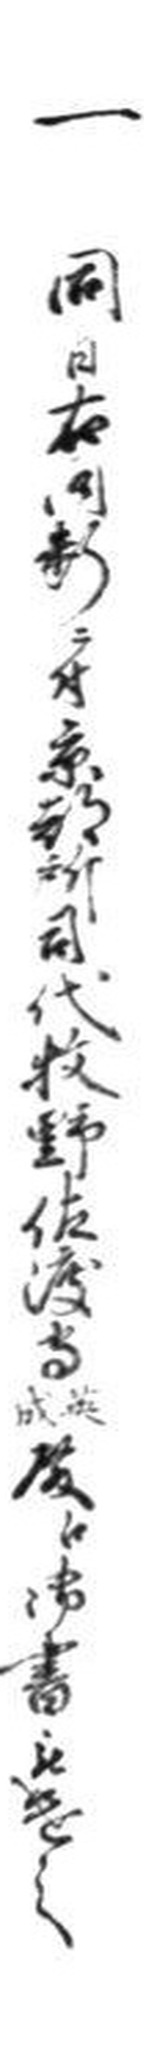一同日右同断ニ付京都所司代牧野佐渡守英成殿江御書被遣之
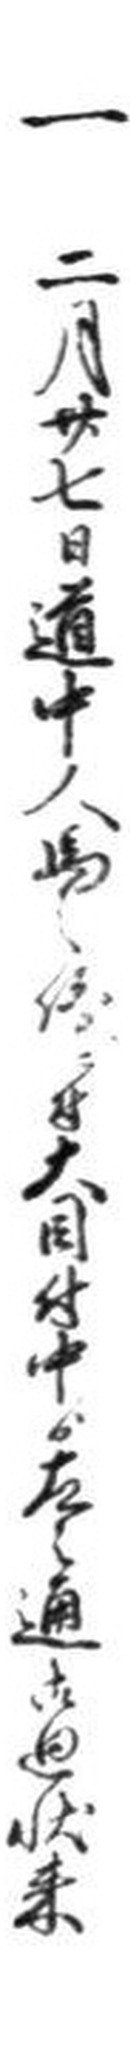一二月廿七日道中人馬之儀ニ付大目付中ゟ左之通御廻状来
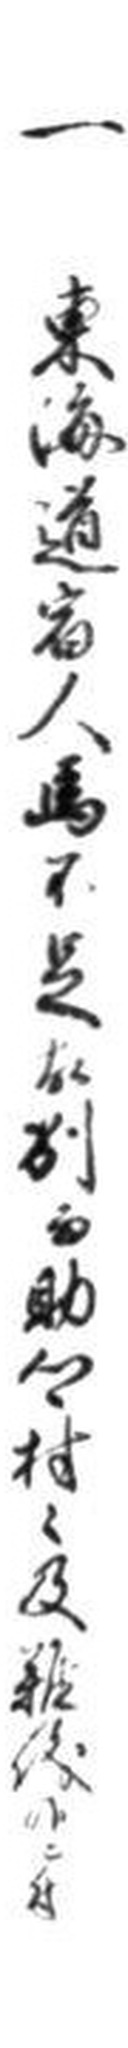一東海道宿人馬不足故別而助郷村々及難儀候ニ付
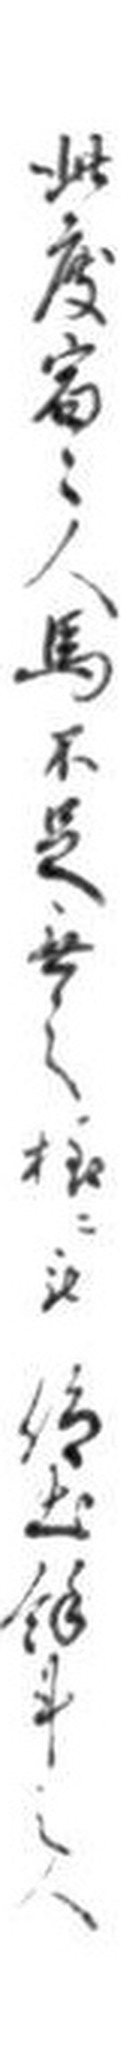此度宿々人馬不足無之様ニ被仰出余計之人
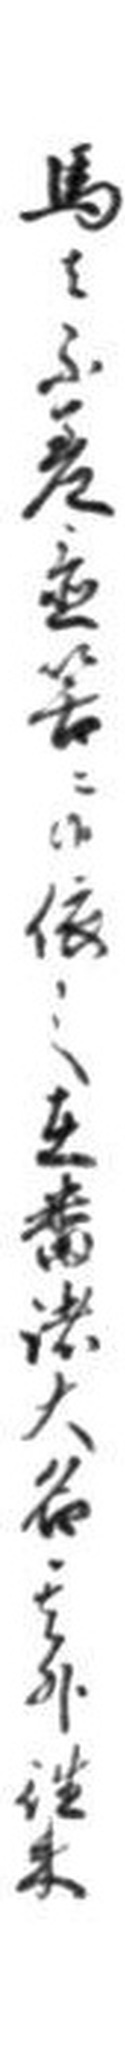馬は不差置筈ニ候依之在藩諸大名其外往来
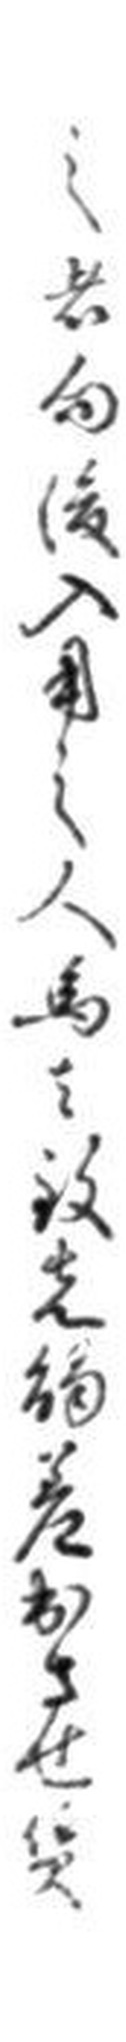之者向後入用之人馬は致先触差出させ賃
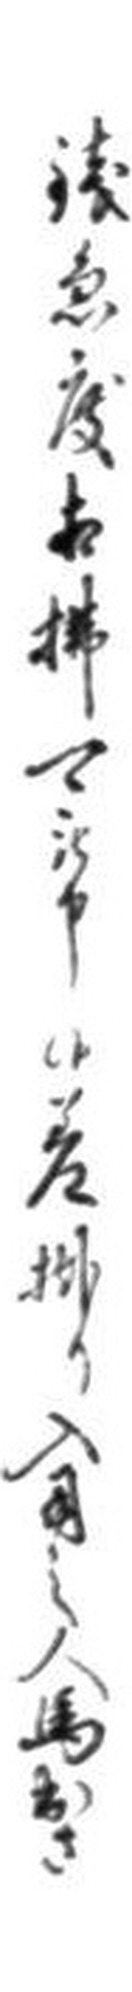銭急度相払可被申候差掛り入用之人馬出さ
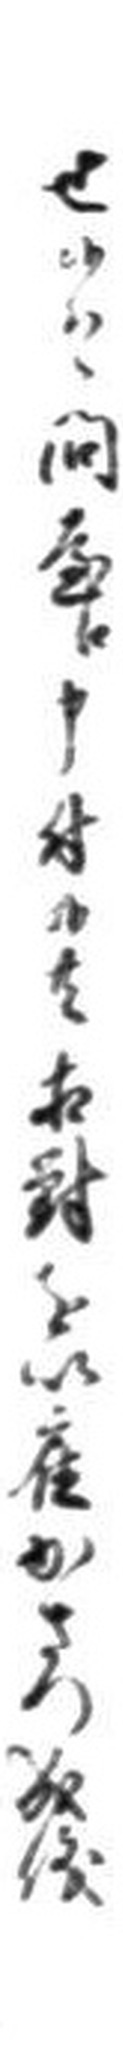せ候ハゝ問屋江申付候共相対を以雇かさつ成儀
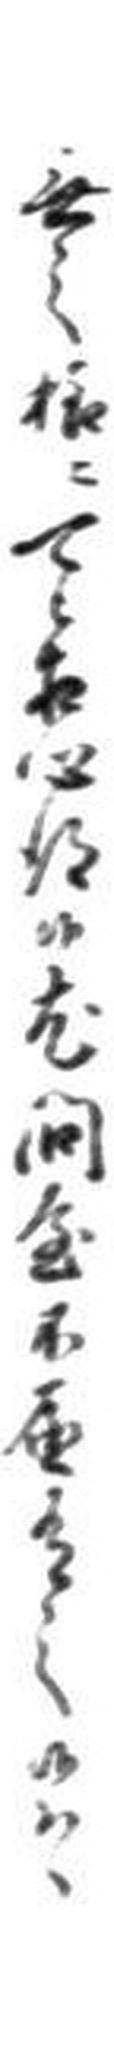無之様ニ可被相心得候尤問屋不届有之候ハゝ
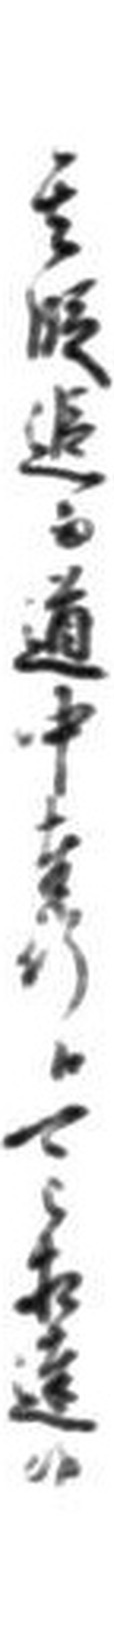其段追而道中奉行江可被相達候
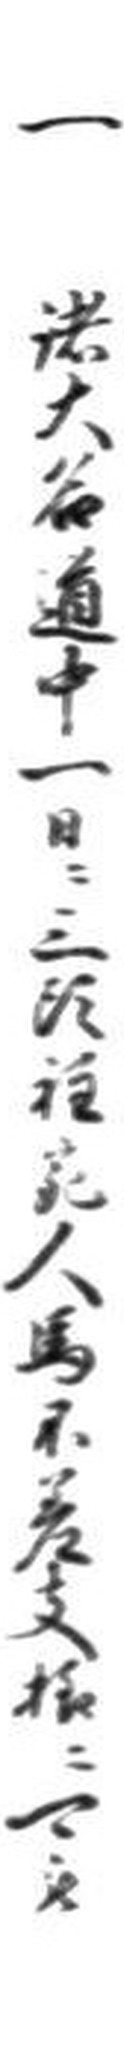一諸大名道中一日ニ三頭程宛人馬不差支様ニ可被
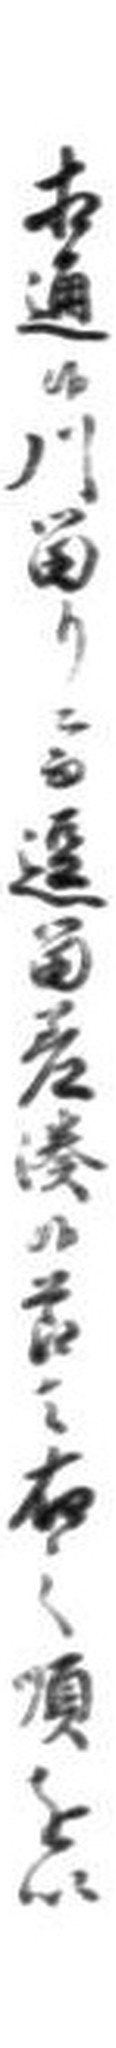相通候川留りニ而逗留差湊候節は右之順を以
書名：家譜 三十九 宗矩公 享保十年
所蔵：福井県文書館 Fukui Prefectural Archives
